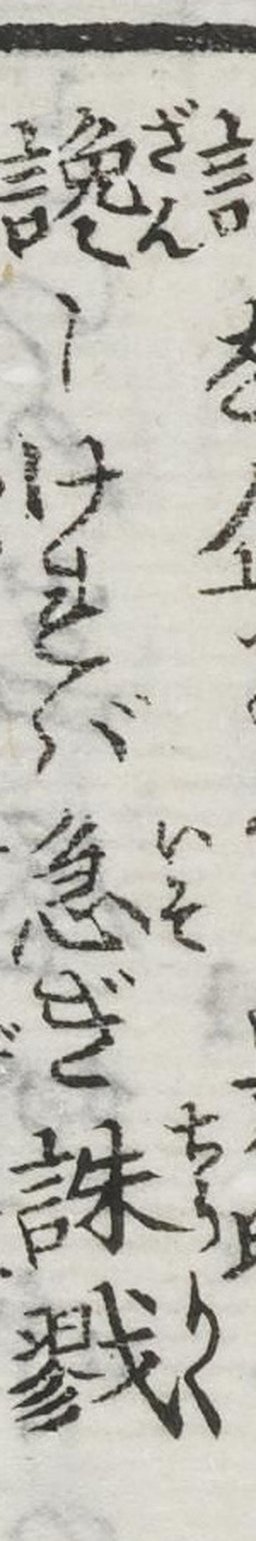讒しければ急ぎ誅戮
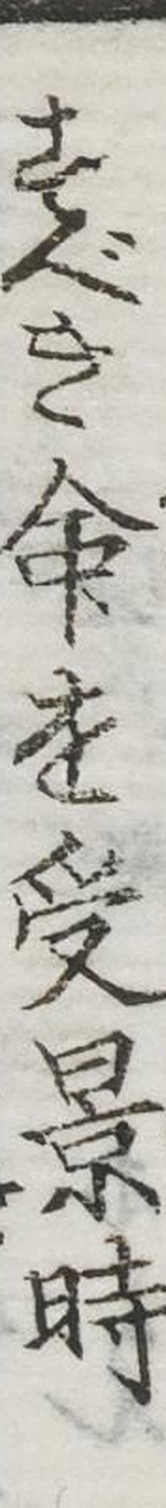すべき命を受景時
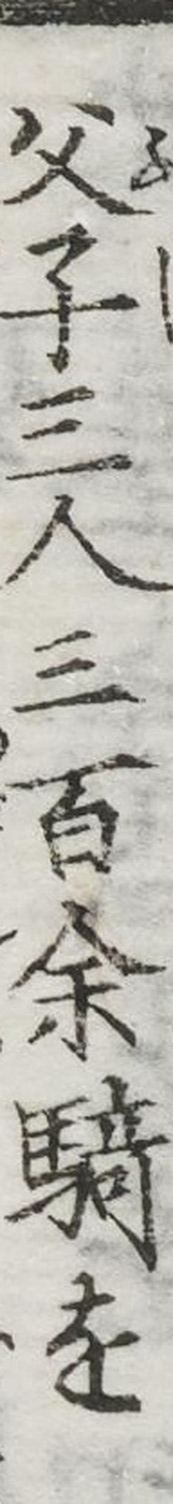父子三人三百余騎を
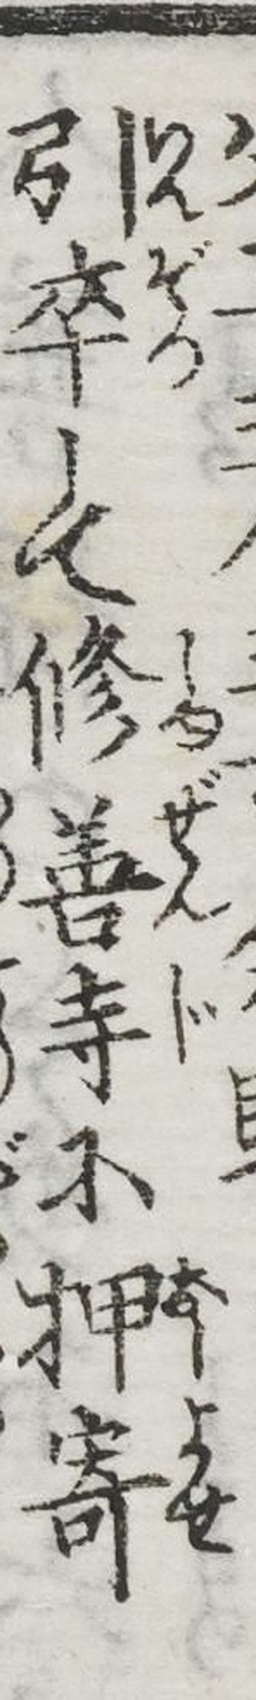引率して修善寺に押寄
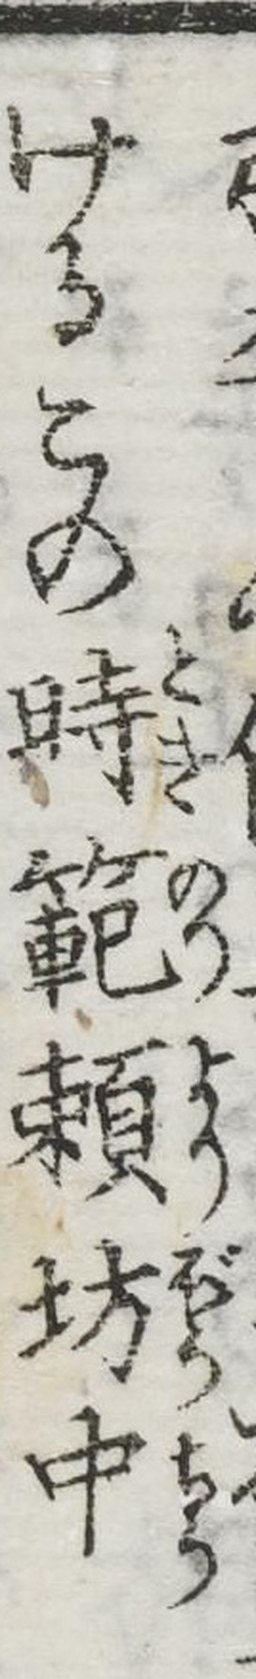けるこの時範頼坊中
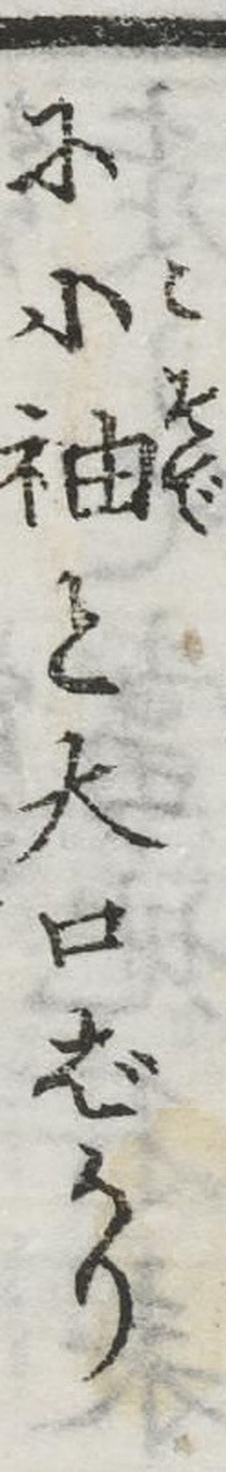に小袖と大口ばかり
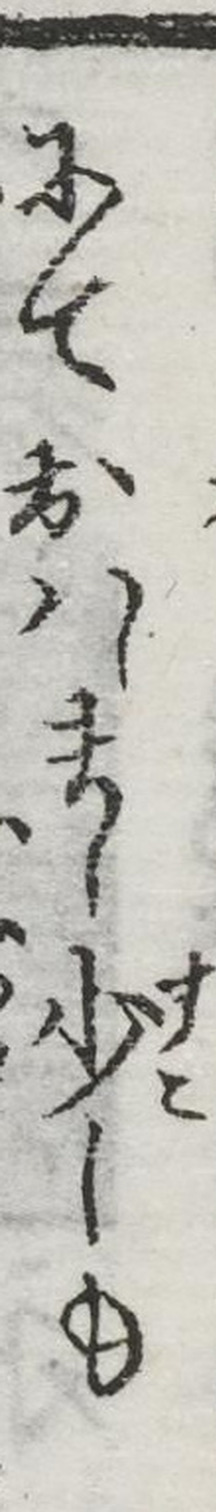にておはしまし少しも
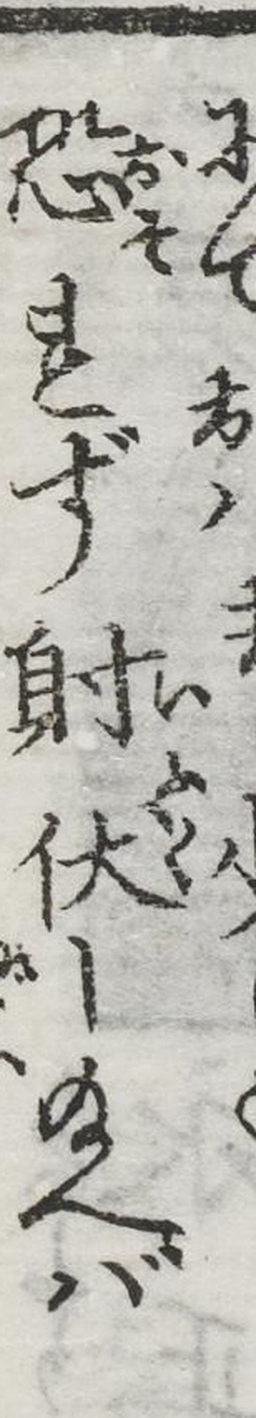恐れず射伏し給へば
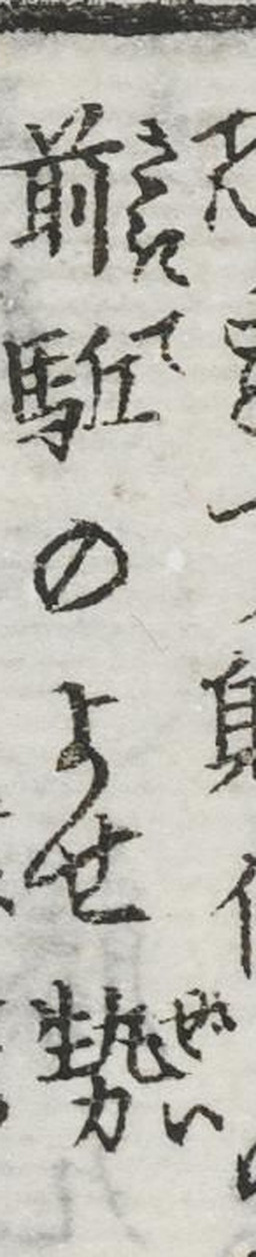前駈のよせ勢
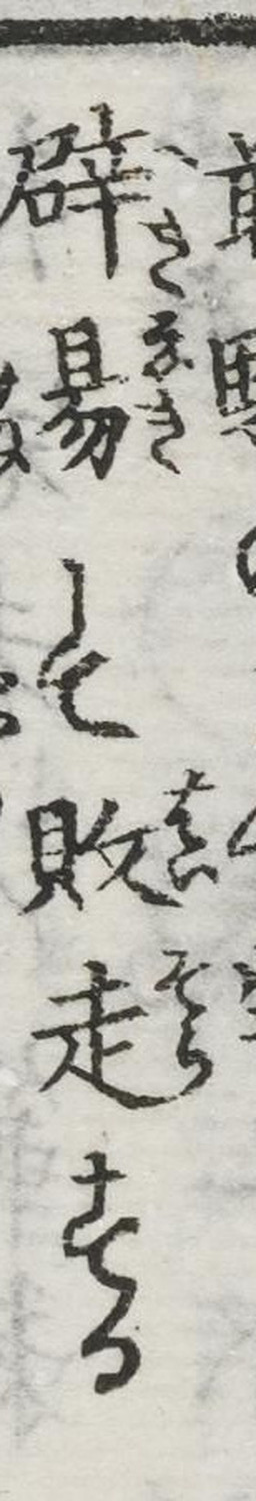辟易して敗走する
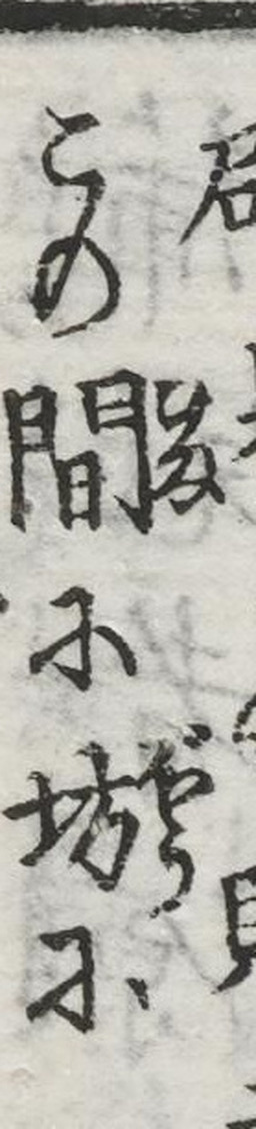この間に坊に
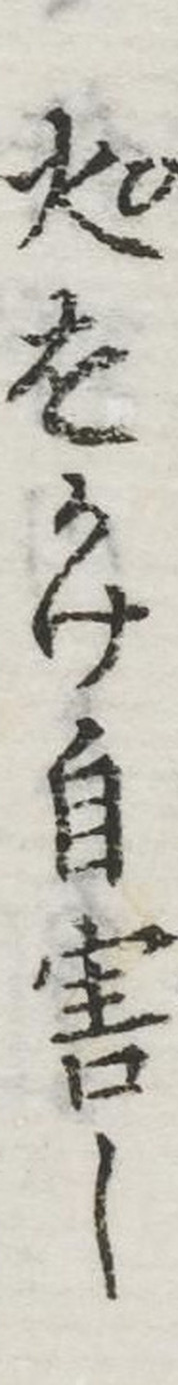火をかけ自害し
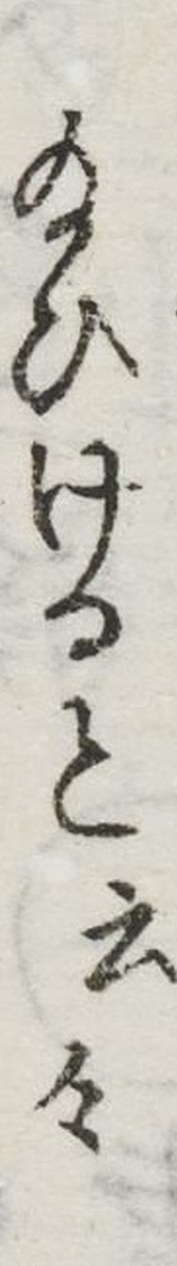給ひけると云々

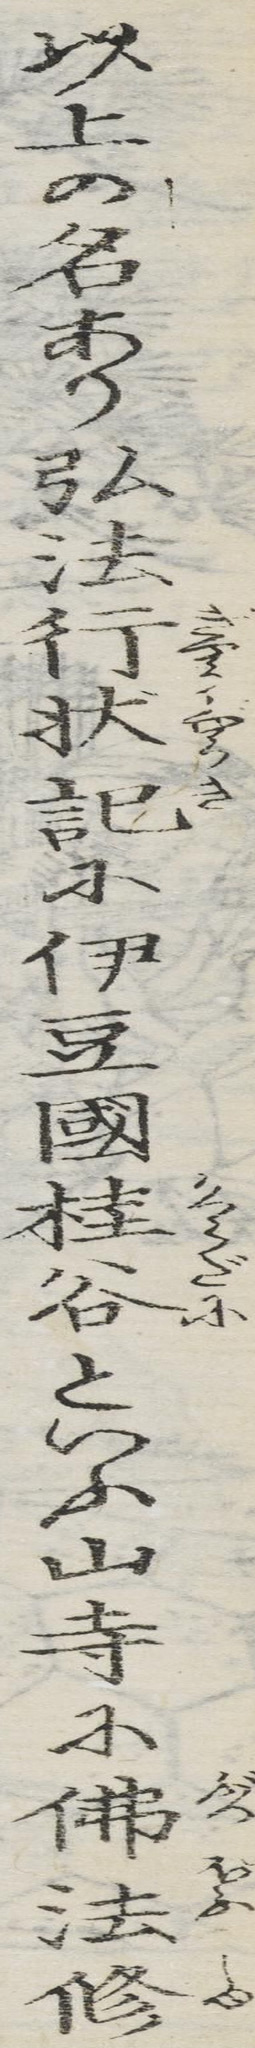以上の名あり弘法行状記に伊豆國桂谷といふ山寺に佛法修
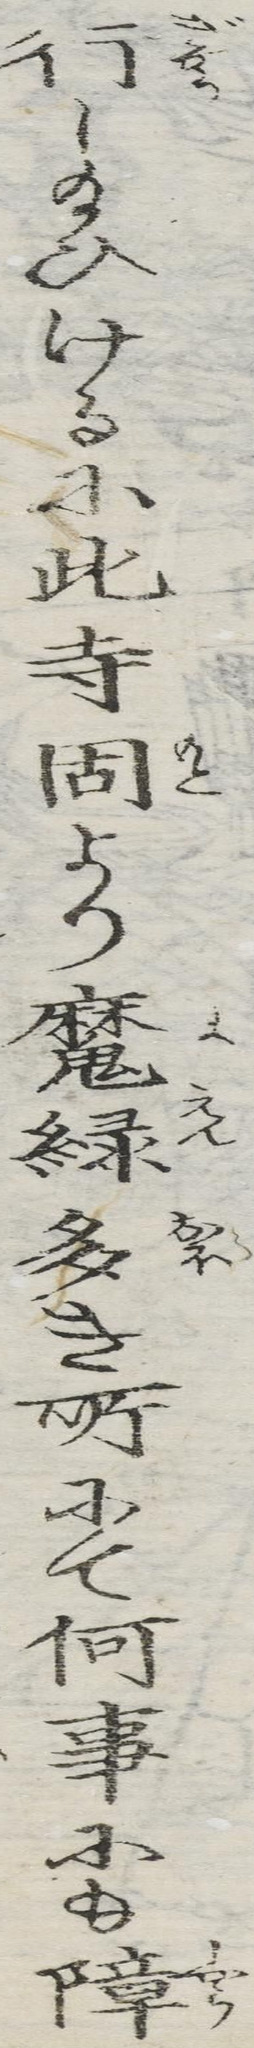行し給ひけるに此寺固より魔縁多き所にて何事にも障
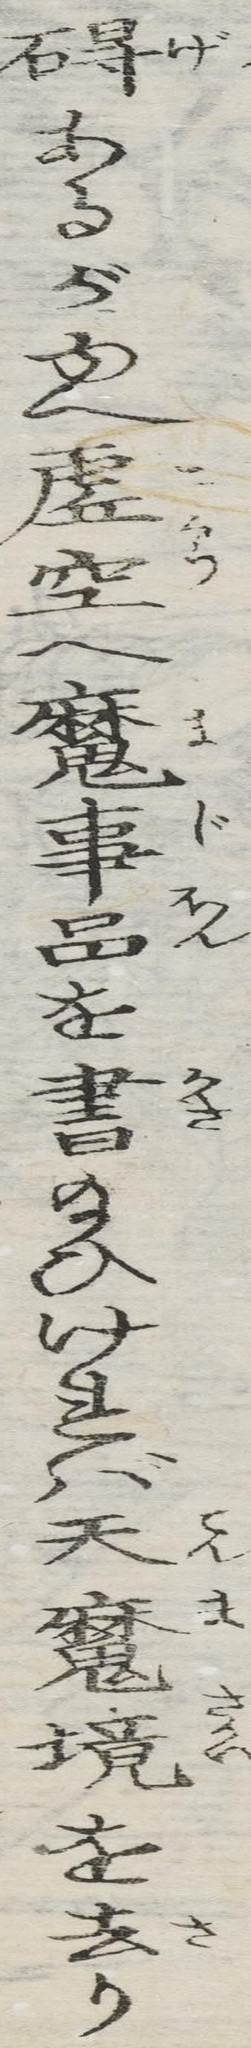碍あるがゆへ虚空へ魔事品を書給ひけれバ天魔境を去り
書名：伊豆国修善寺温泉名所記　全
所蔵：東京大学地震研究所図書室 Earthquake Research Institute Library, The University of Tokyo, JAPAN
